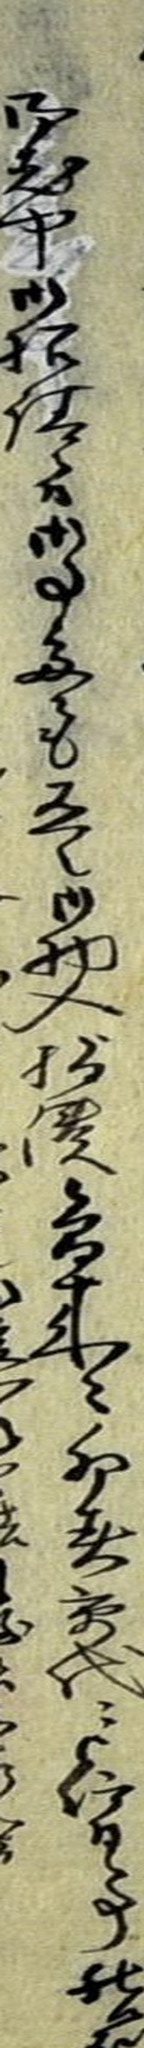御老中御招請に付御事多にも有之御物入指湊候間来々卯春交代に被仰付事然処
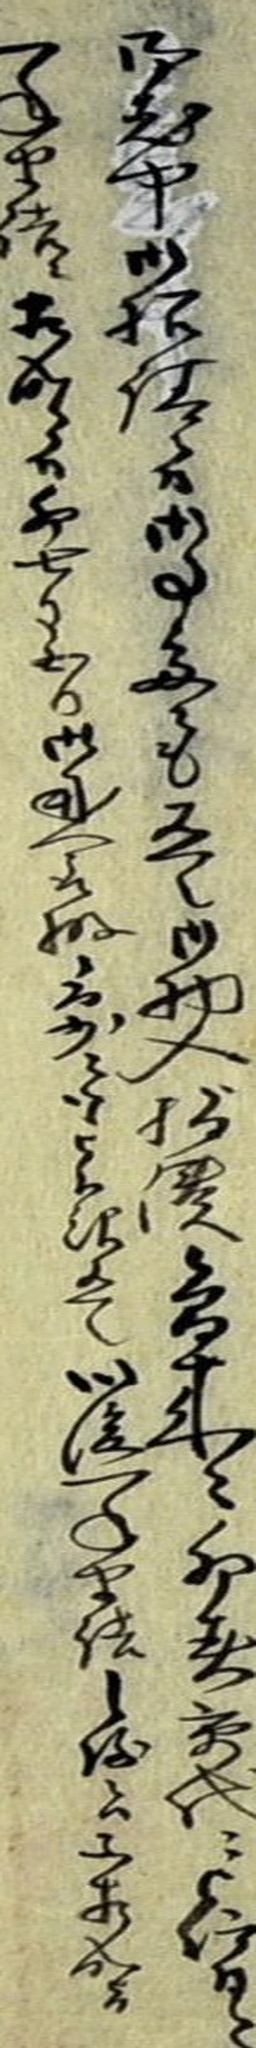一年半詰に相成に付卯七月五日御用人取扱に而少々ツヽ被下銀有之以後一年半詰之儀には不相成旨
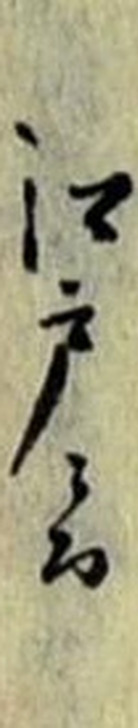江戸に而
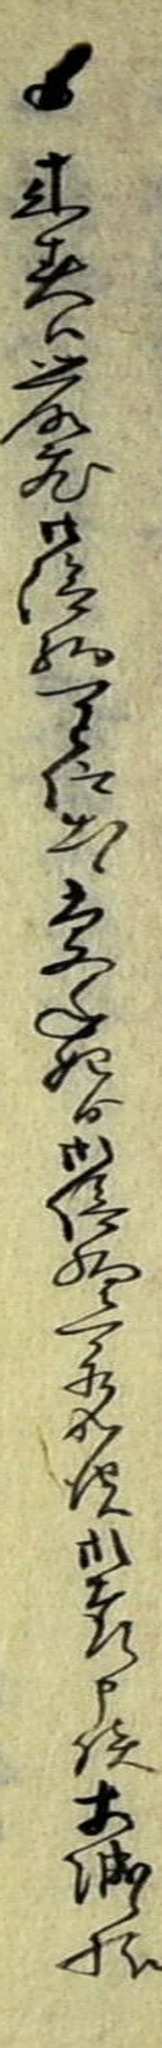〇来春は厳敷御倹約可被仰出候尚又年始ゟ御倹約に可相成儀は御奉行申談相減候様
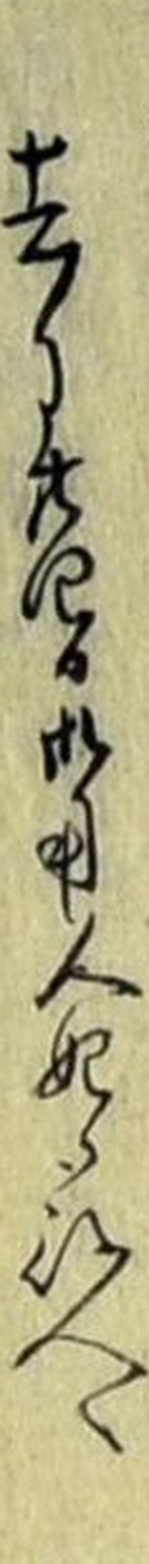十一月廿四日御用人始御役人へ

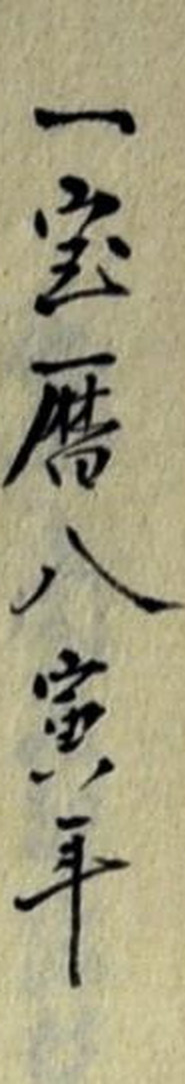一宝暦八寅年
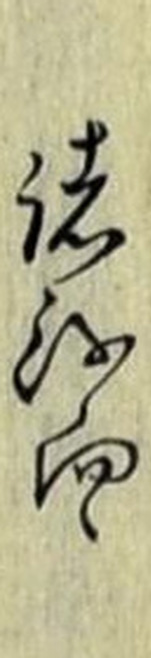諸役向へ
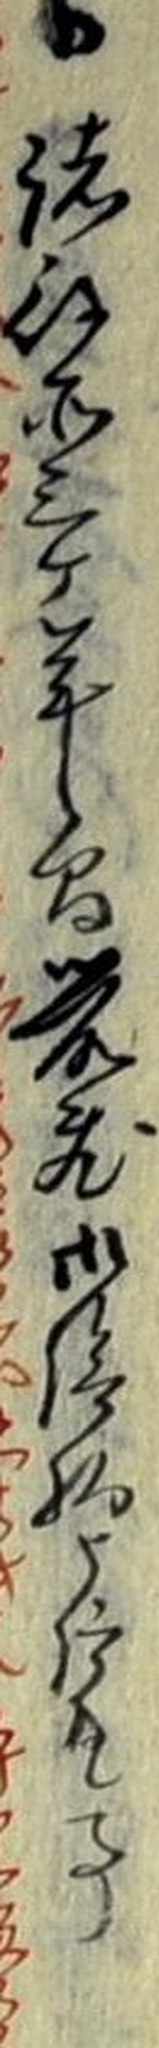〇諸役所三ヶ年之間厳敷御倹約被仰付候事
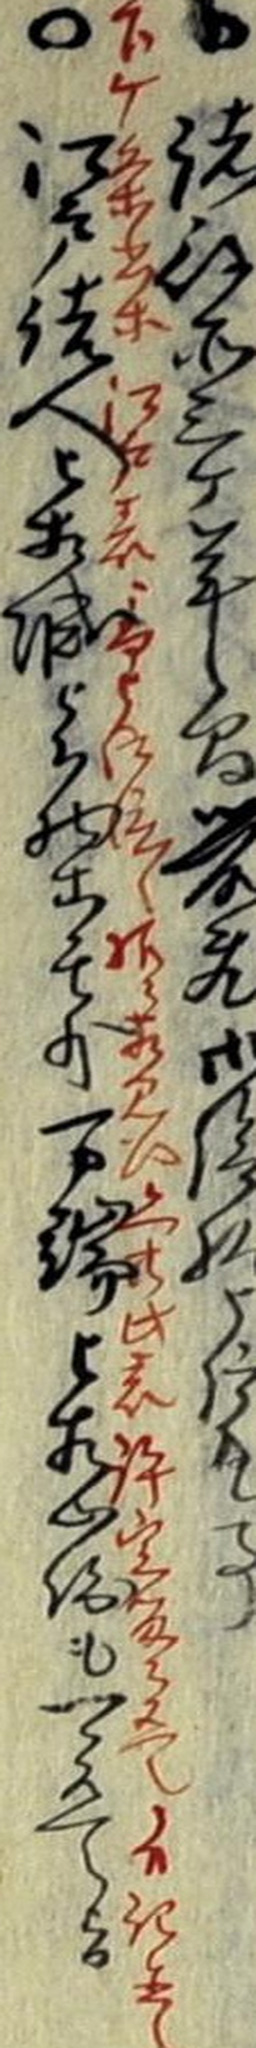〇江戸詰人被相減被下物等其外万端被相止儀も可有之旨
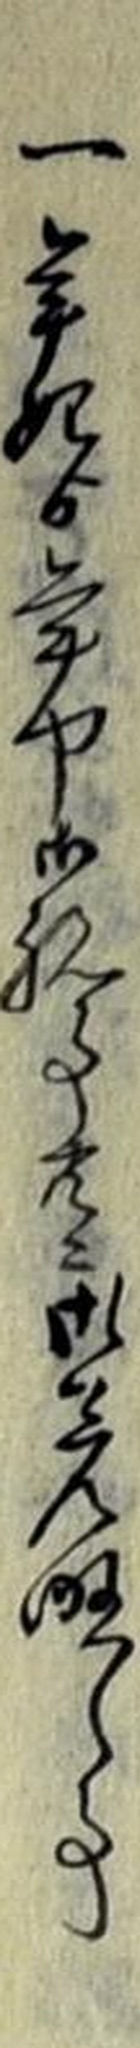一年始ゟ年中御祝事共に御差略之事
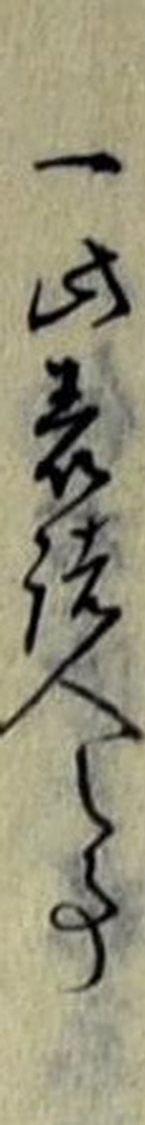一此表詰人之事
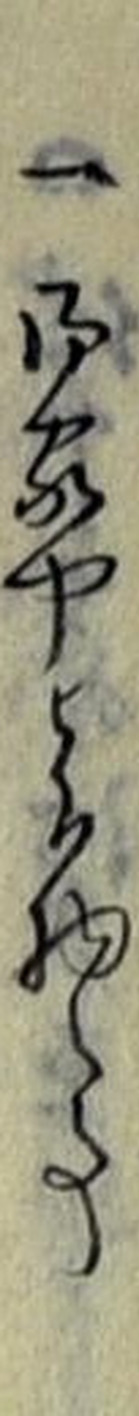一御家中被下物之事
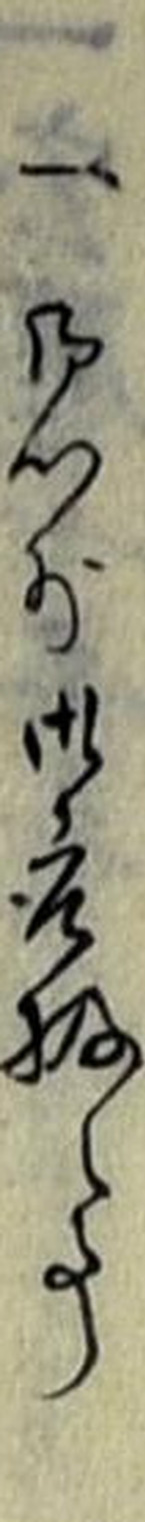一御門外御取扱之事
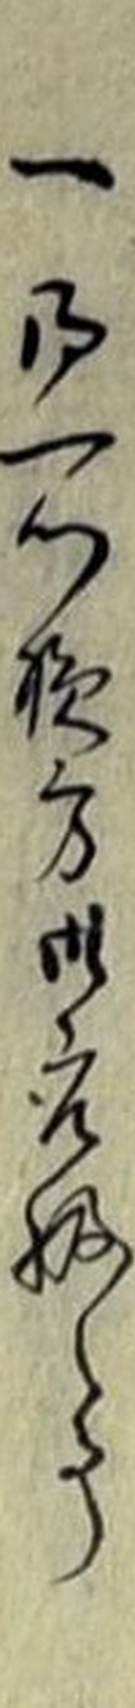一御一門様方御取扱之事
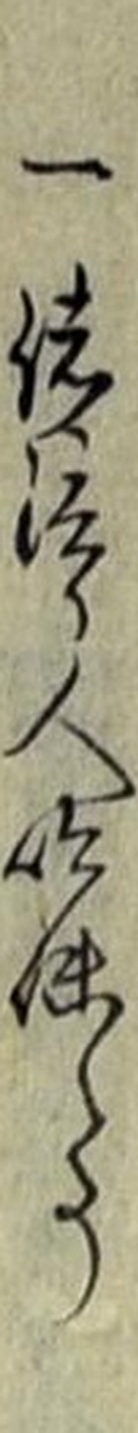一諸渡り人吟味之事
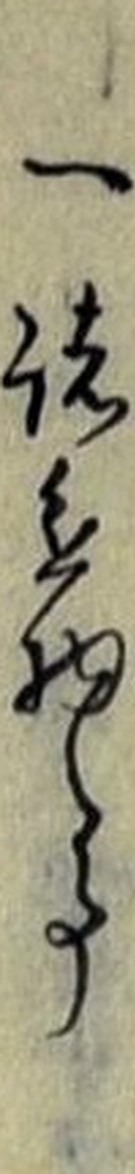一諸進物之事
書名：命令之部 二
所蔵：福井県文書館 Fukui Prefectural Archives
